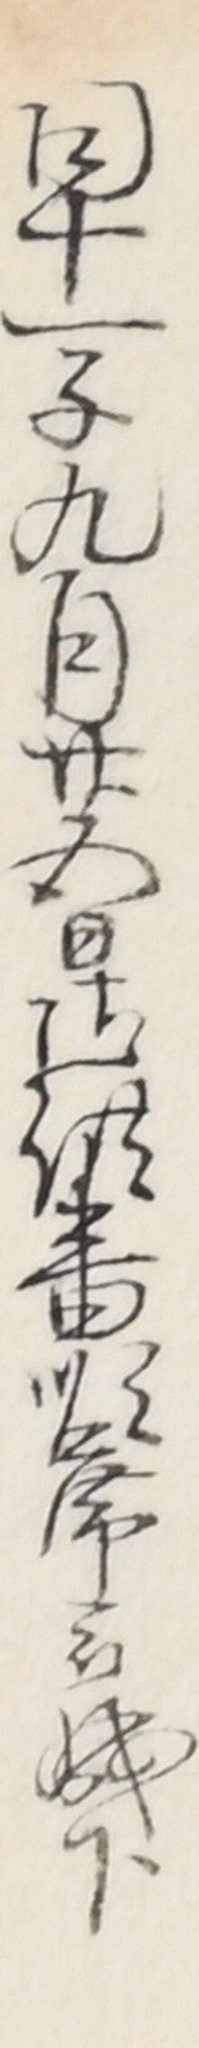一同十一子九月廿五日御供番順席被成下
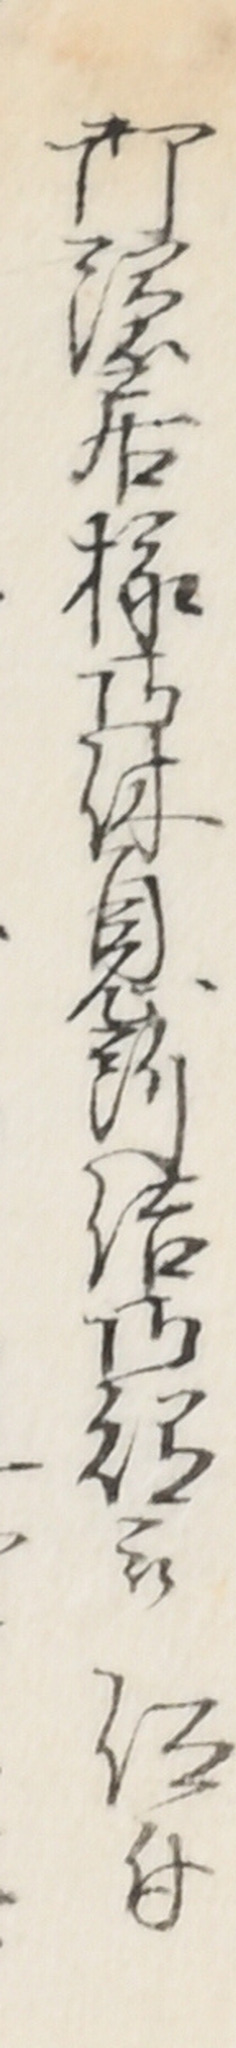御隠居様御休息所詰御賄被仰付
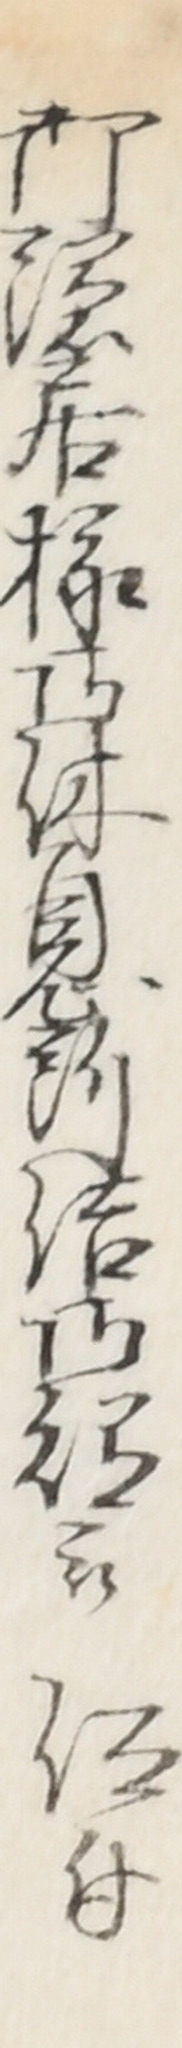御隠居様御休息所詰御賄被仰付
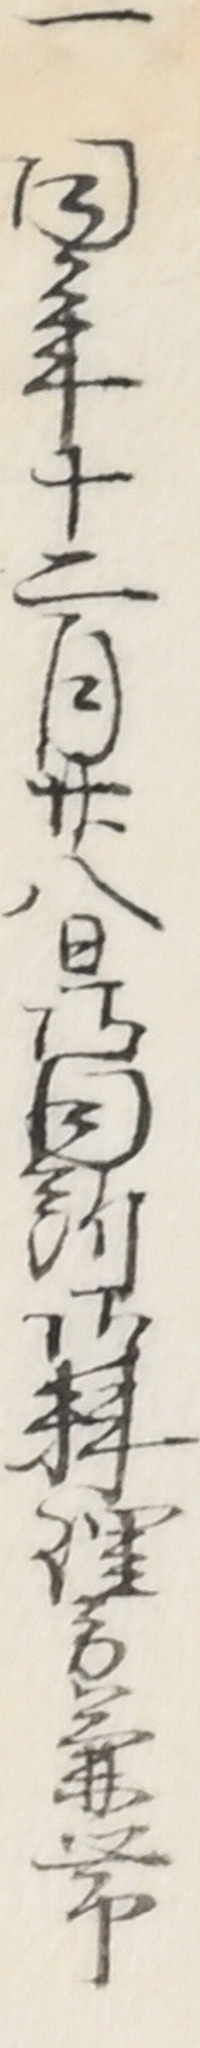一同年十二月廿八日御同所御料理方兼帯
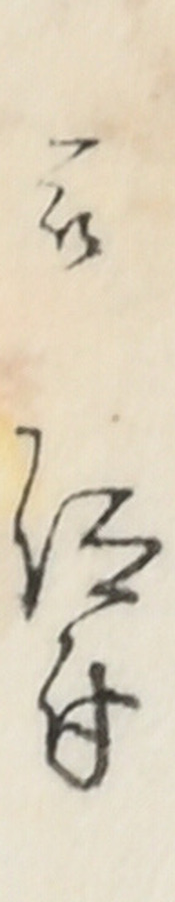被仰付
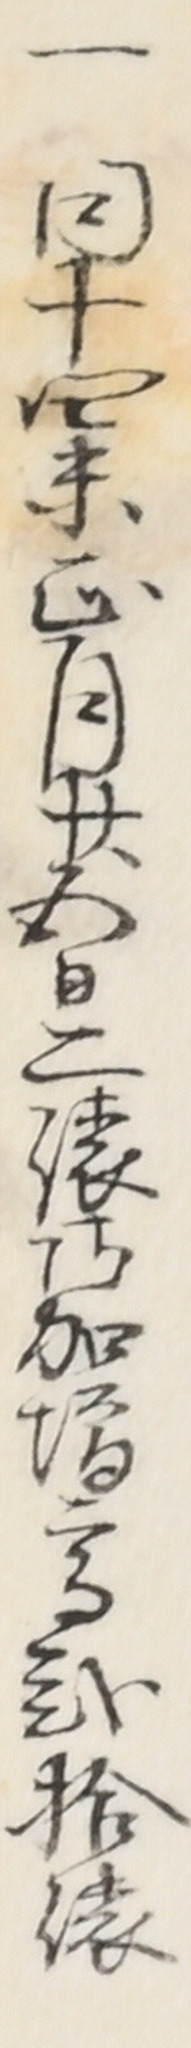一同十四未正月廿五日二俵御加増高弐拾俵
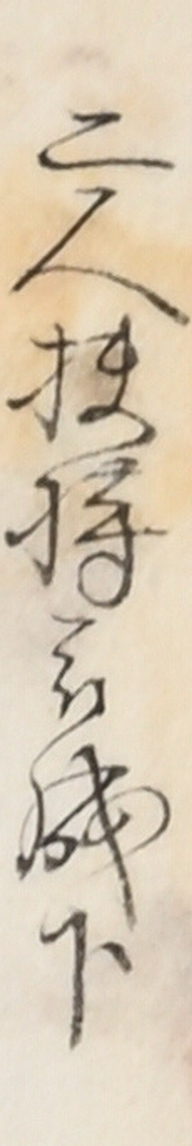二人扶持被成下
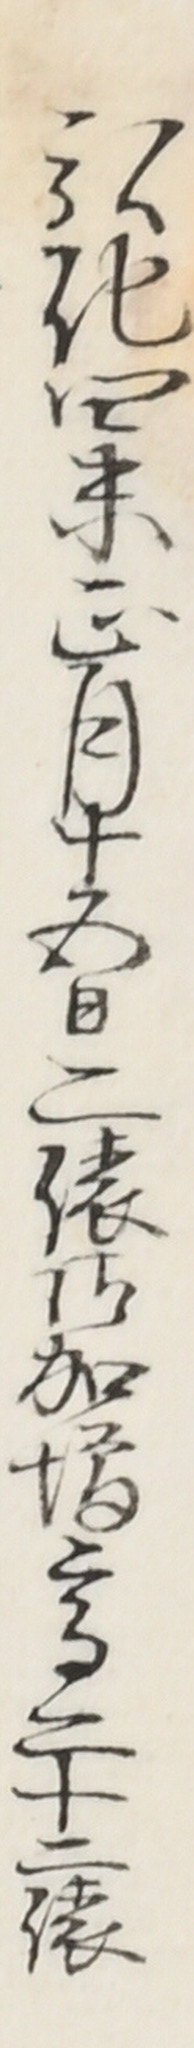一弘化四未正月十五日二俵御加増高二十二俵
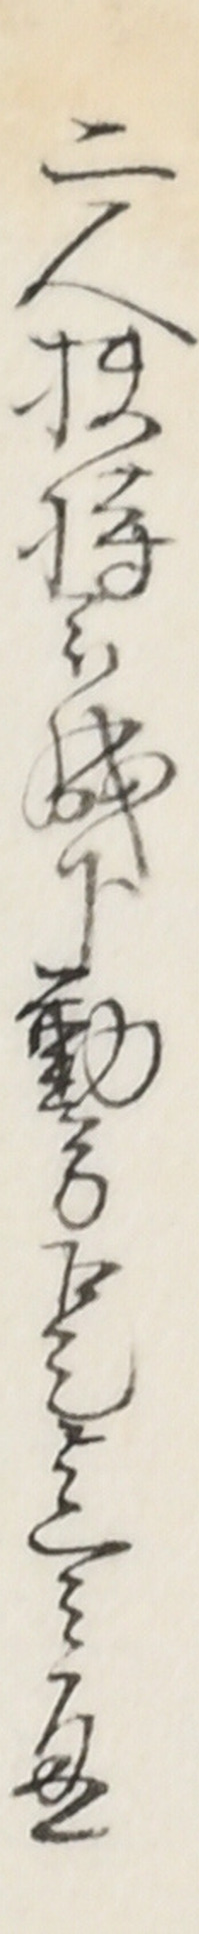二人扶持被成下勤方是迄之通
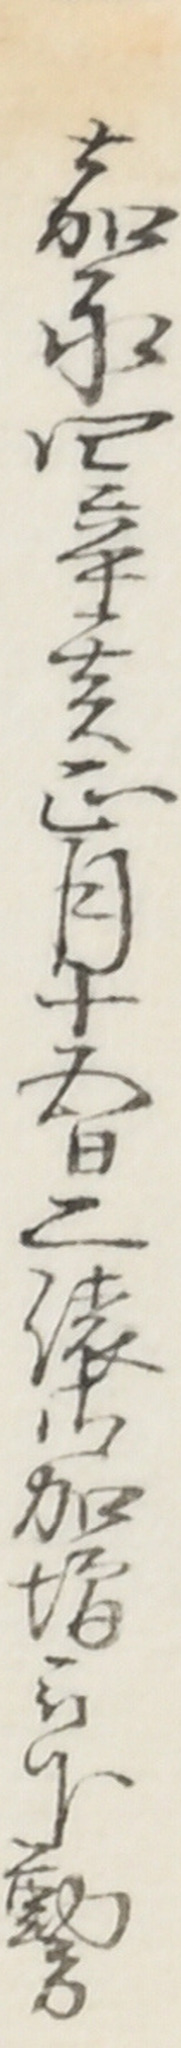一嘉永四辛亥正月十五日二俵御加増被下勤方
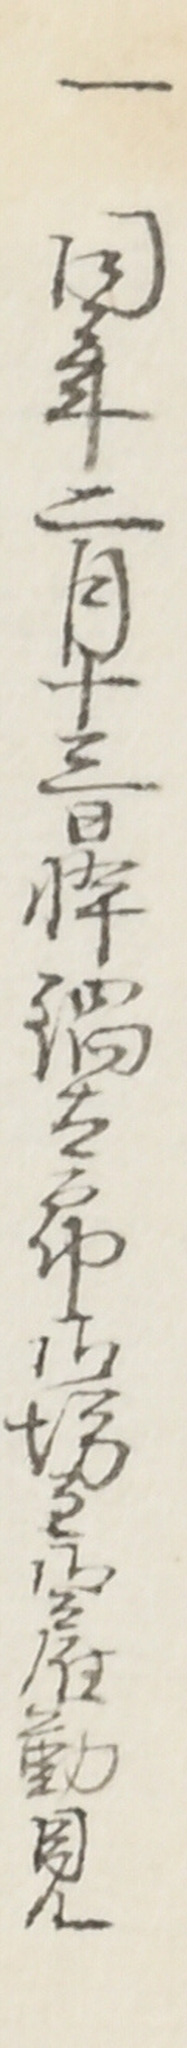一同年二月十三日忰鍋太郎御坊主御雇勤見
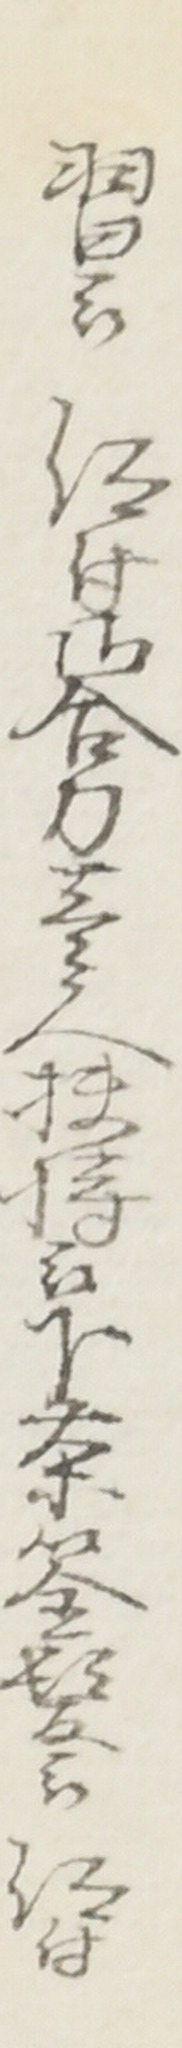習被仰付御合力壱人扶持被下茶筌髪被仰付
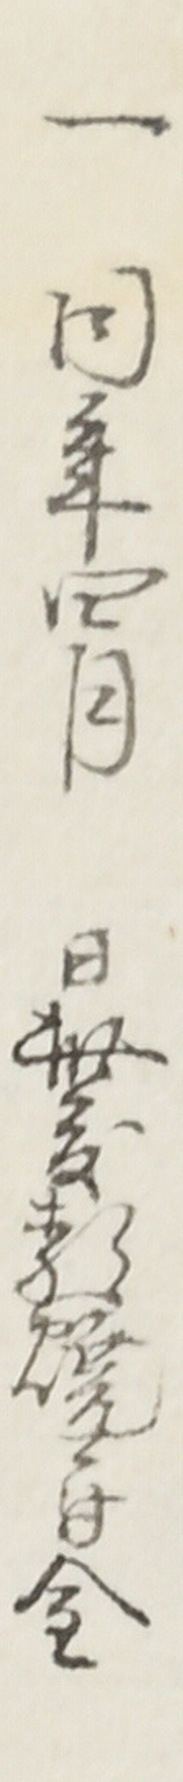一同年四月日此度類焼ニ付金

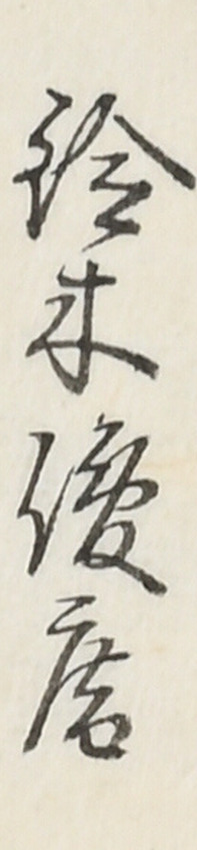鈴木俊庵
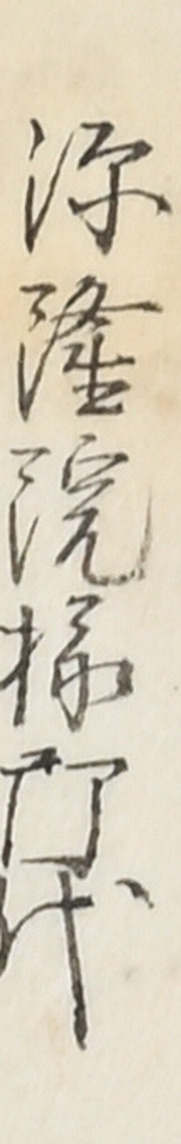源隆院様御代
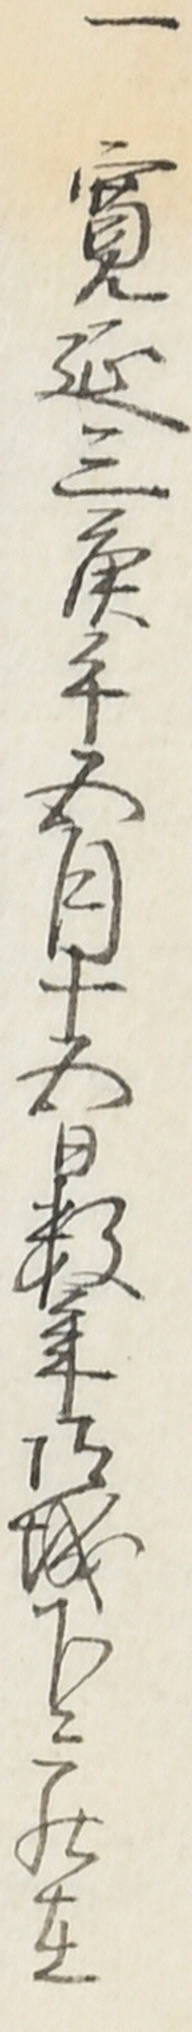一寛延三庚午五月十五日数年御城下ニ罷在
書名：給人諸士勤仕録（七）
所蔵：伊那市立高遠町図書館・合同会社AMANE
